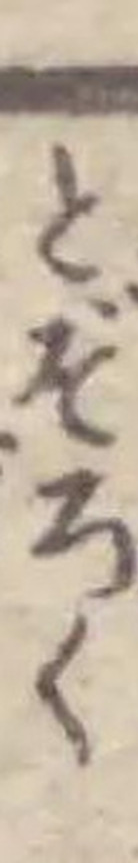とぞろく
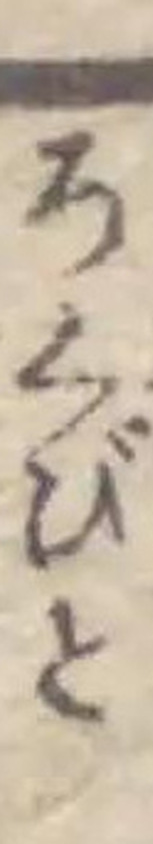ろくびと
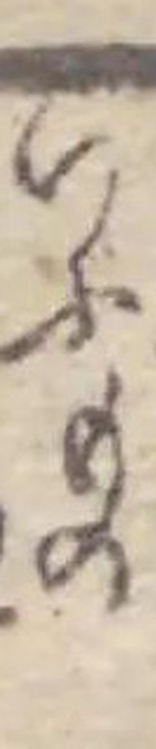いふもの
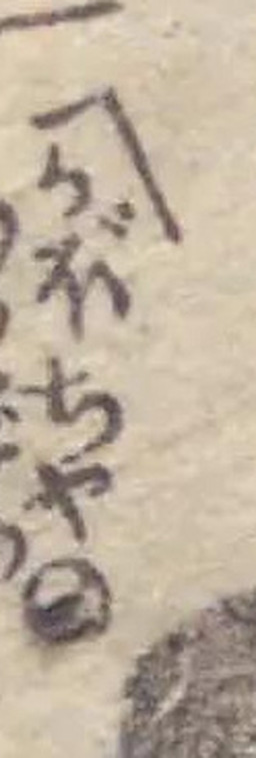〽かぼちやの
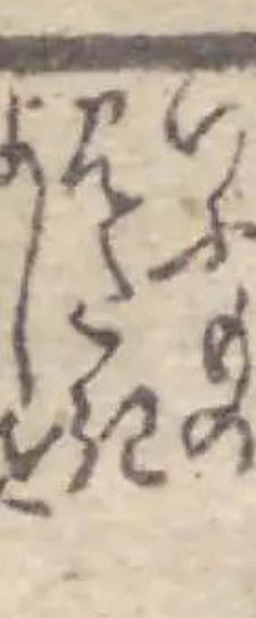見たき
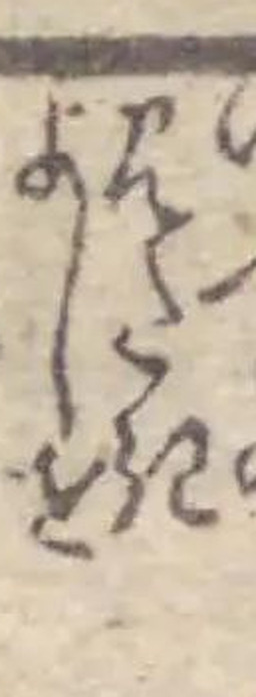よしを
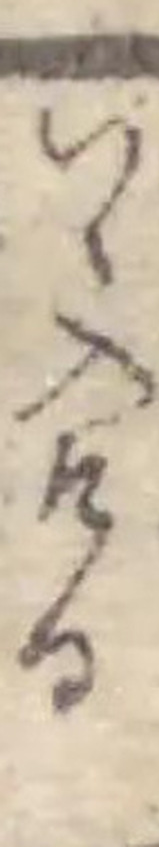いゝ入ける
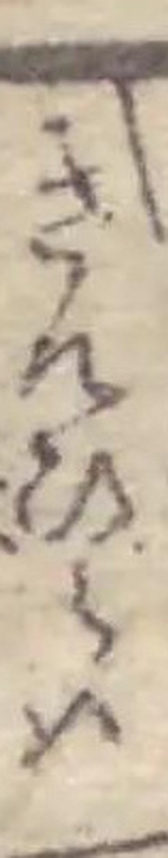〽きんひらは
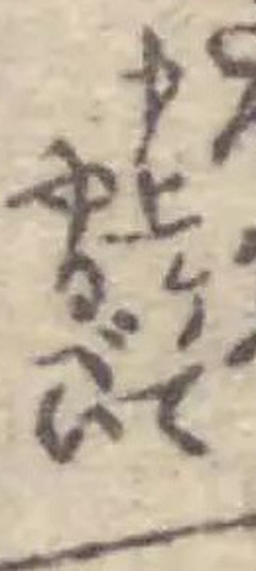やるべい

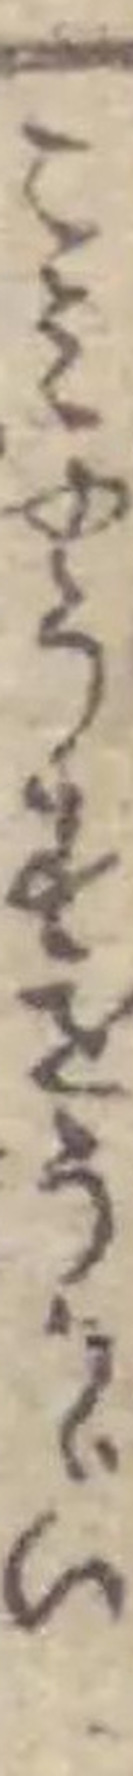こみやうすをうかゞい
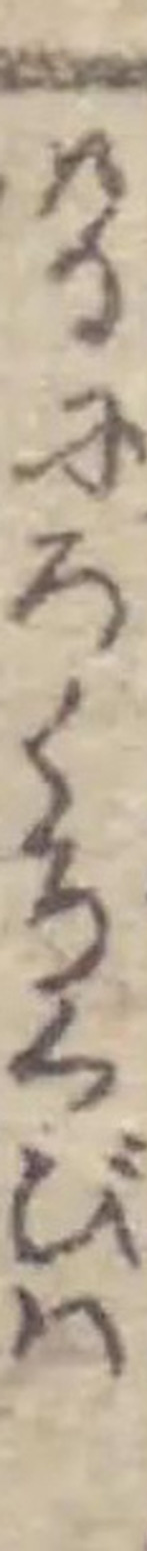けるにろくろくびは
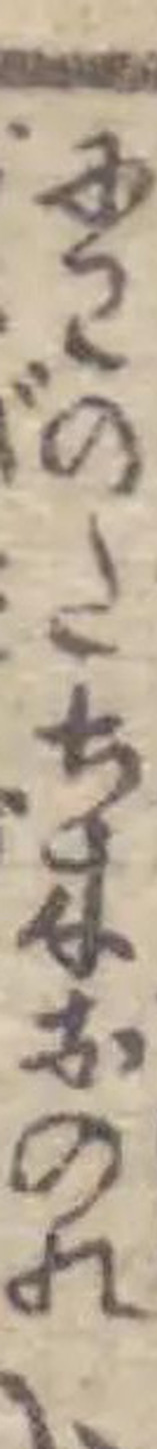にわのたち木おのれ
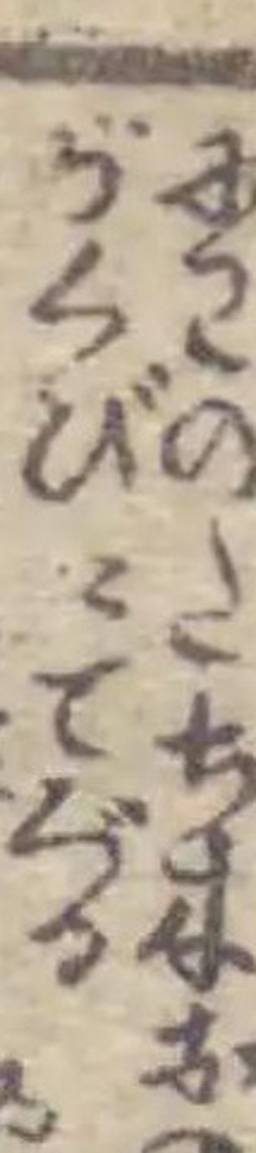がくびにてぐる
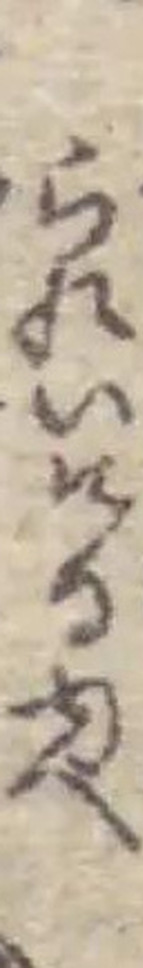られいけるゆへ
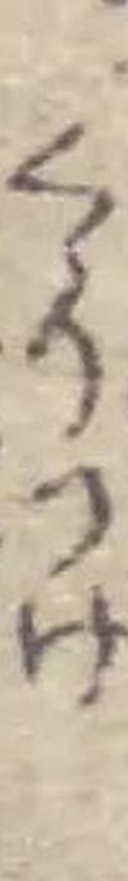くゝりつけ
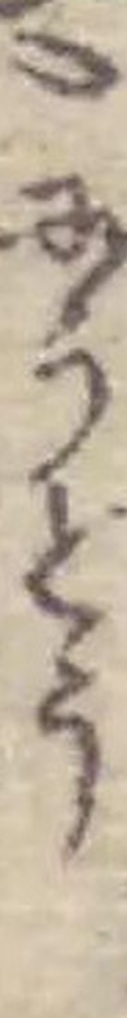にうどう
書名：化物尽 4巻
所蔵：国立国会図書館 National Diet Library, JAPAN
